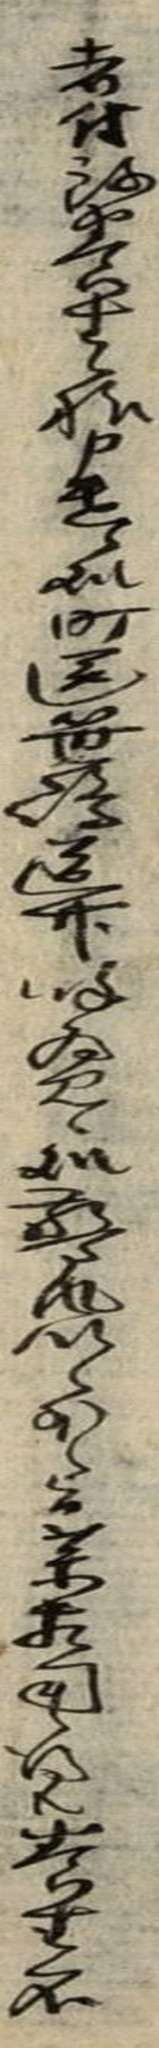者付致養生候様申遣候処町医笹島道竹呼為見候処驚風以之外之旨薬相用候得共養生不
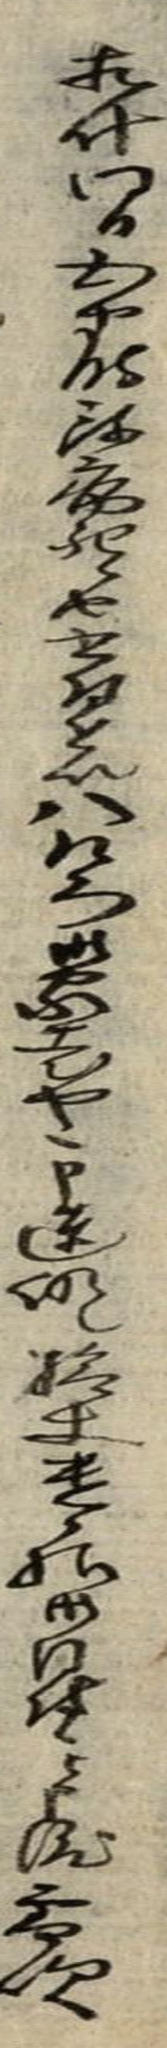相叶同日五半時致病死候由書付を以八左衛門御家老中へ申達仍之検使遣候様御目付へ被申渡雪吹
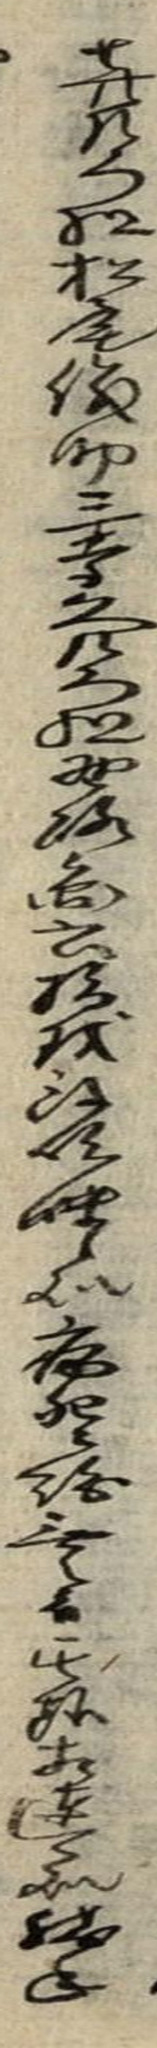喜左衛門組松尾儀助三寺久左衛門組野路円六指越致吟味候処病死に紛無之に付其趣相達候処勝手
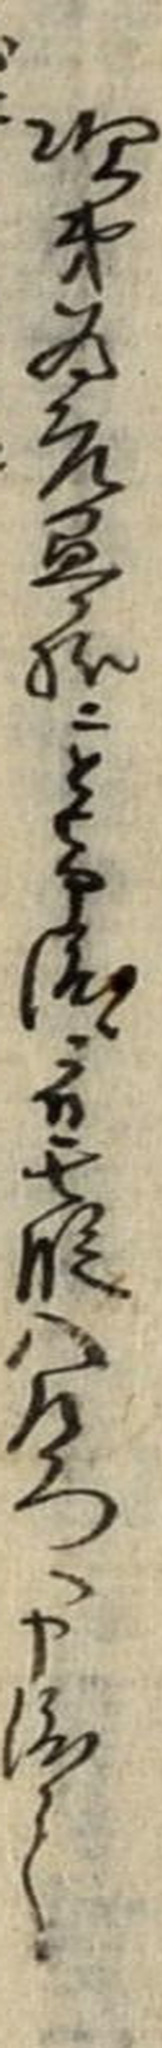次第為差置候様にと被申渡候に付其段八左衛門へ申渡之
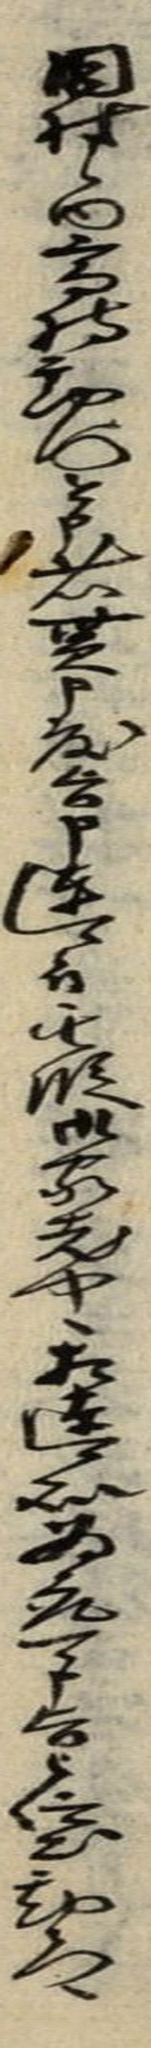同村之内高持勘右衛門と申者貰申度旨申達候に付其段御家老中へ相達候処為取可申旨被仰出勘右衛門へ
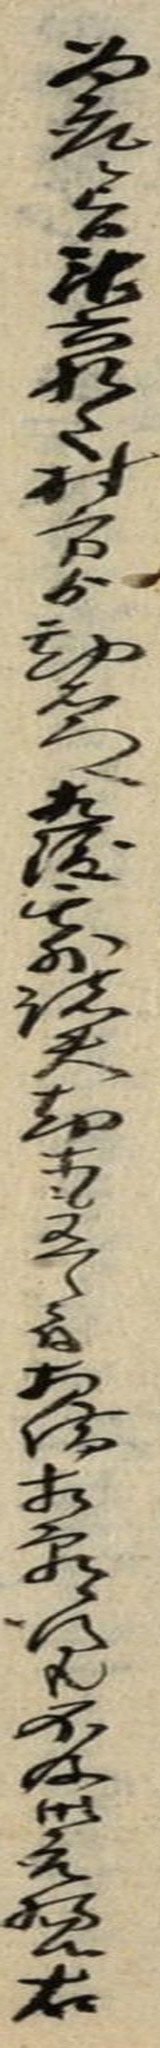為取候旨銀六拾匁村方ゟ勘右衛門へ相渡其外諸失却等も有之に付拝借相願候得共不及御取揚候右
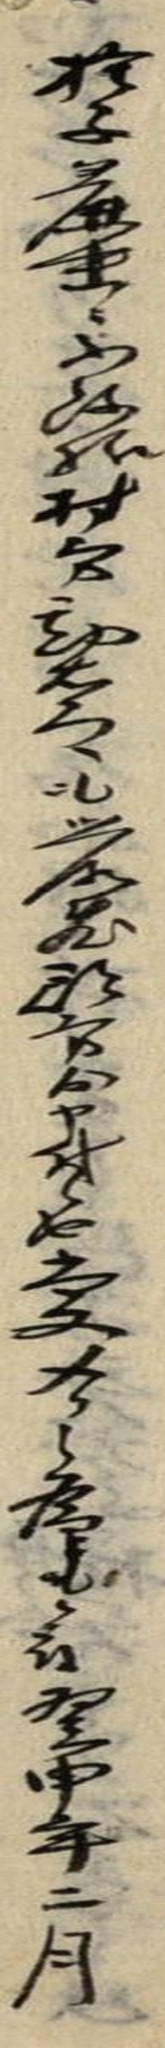捨子麁末に不致様村方勘右衛門へも厳敷郡方ゟ申付候由尚又〆り之為にも候に付翌申年二月
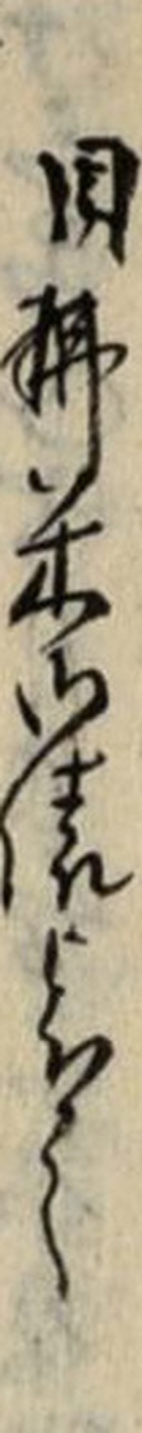御払米弐俵被下之
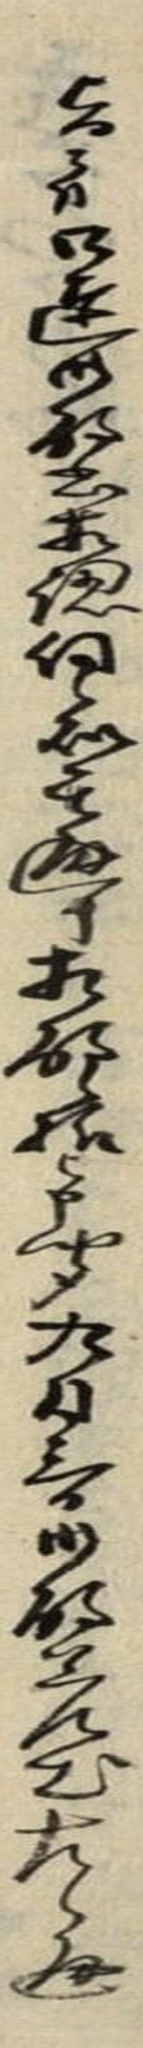旨に付口達御触書相認伺候処其通り相触候様被申聞九月三日御触差出左之通
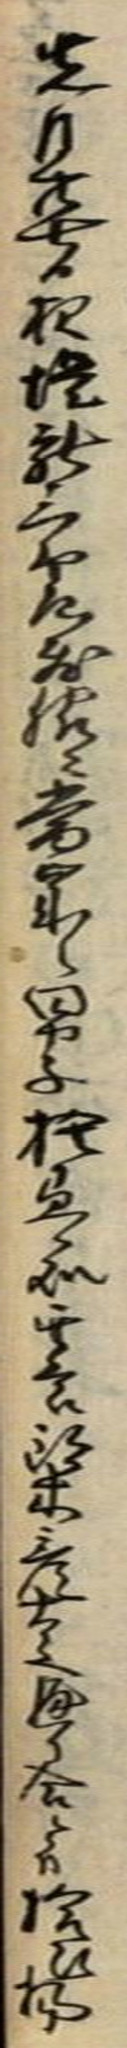先月廿七日夜堤新三郎屋敷脇に当歳之男子捨置候処鈴木彦大夫通り合候に付拾ひ揚
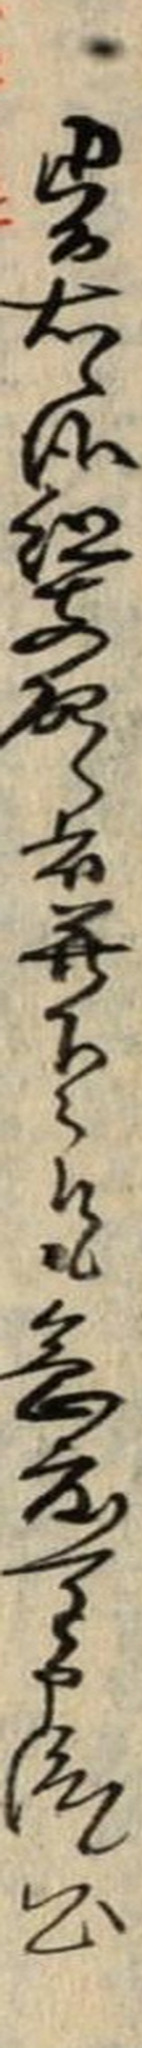追て右之趣組支配之者并下々えも急度可被申渡候以上
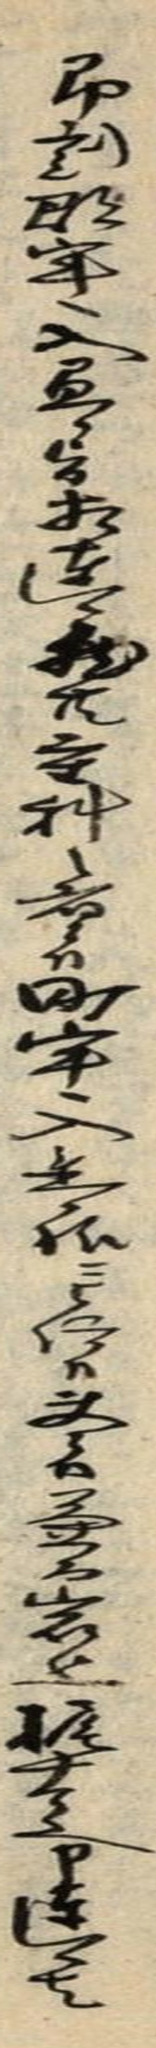即刻郡牢へ入置候旨相達候然共重科之者に付町牢へ入置候様に被仰付夫に付兼て岩上梶大夫申達候は
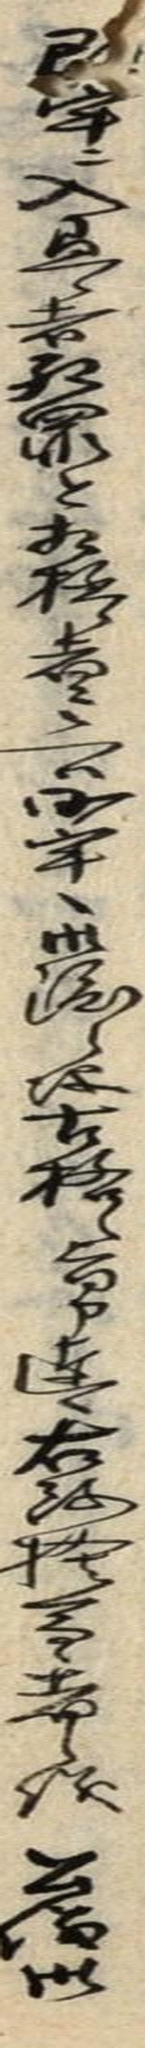郡牢に入置候者死罪と相極候者に候へは町牢へ御渡之儀古格之旨申達候右致捨馬候者之儀公儀御
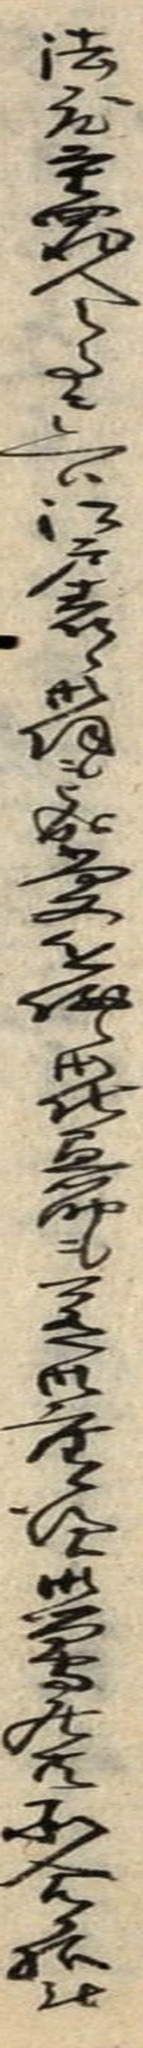法度重罪人之事に候へは江戸表へ御伺も被成尚又近例之御仕置筋も可有御座候得は御留守居共承合候様被
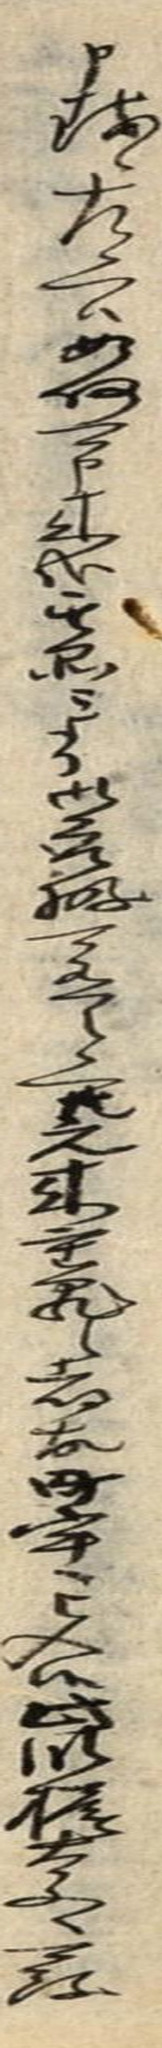申越候左候へは如何可申来哉其品により御取扱可有之候へ共元来重罪之者故町牢へ被入候此段梶大夫へ可致
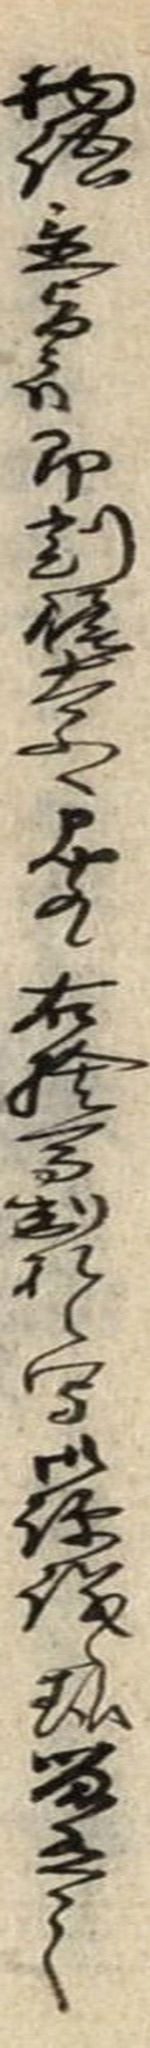物語置旨に付即刻梶大夫へ申聞候右捨馬制札之写御評議之趣留有之
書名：御停止異変死失
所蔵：福井県文書館 Fukui Prefectural Archives
